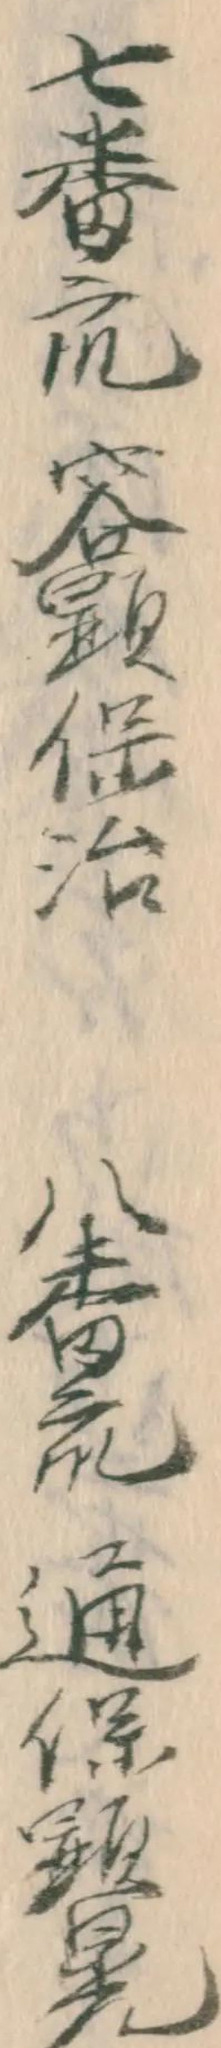七番衆容顕保治八番衆通保顕晃
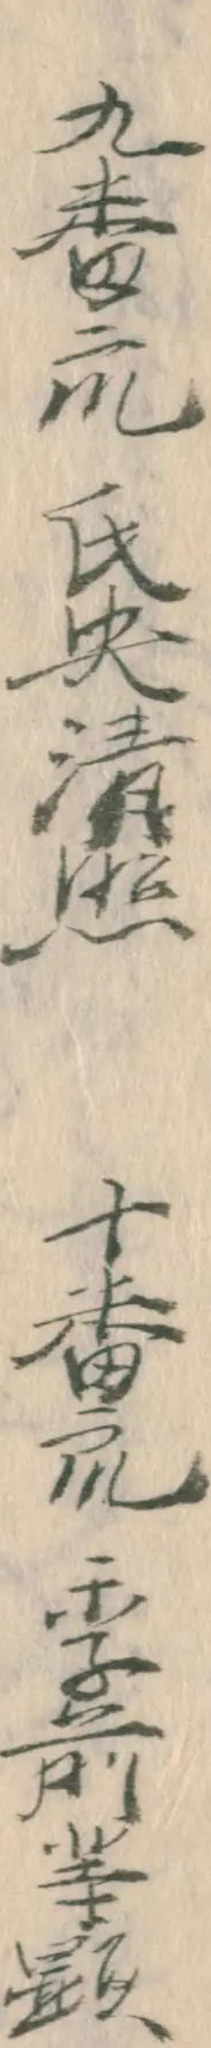九番衆氏央清照十番衆季前等顕
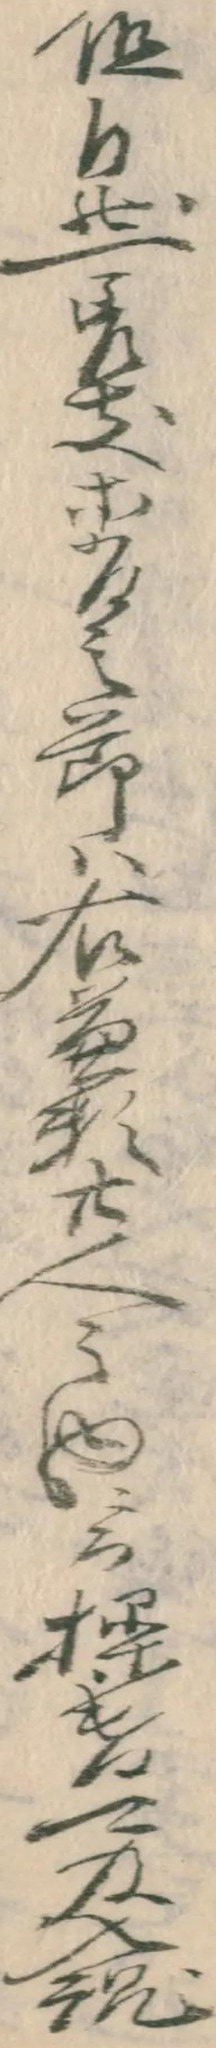但自然差支等有之節ハ右兼頼廿人之内ニ而操遣可及入魂
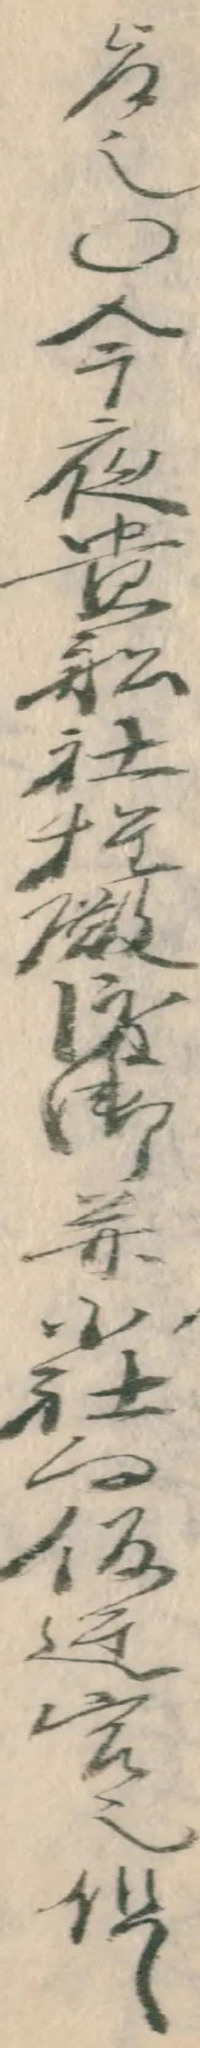旨也○今夜貴舩社権殿渡御并小社向仮遷宮也但し
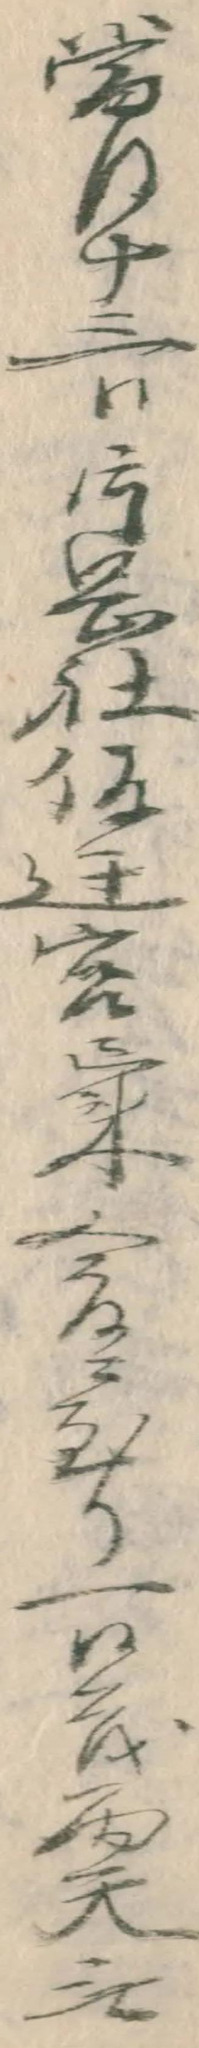當月十三日片岡社仮遷宮已来今日ニ至り一日も雨天無
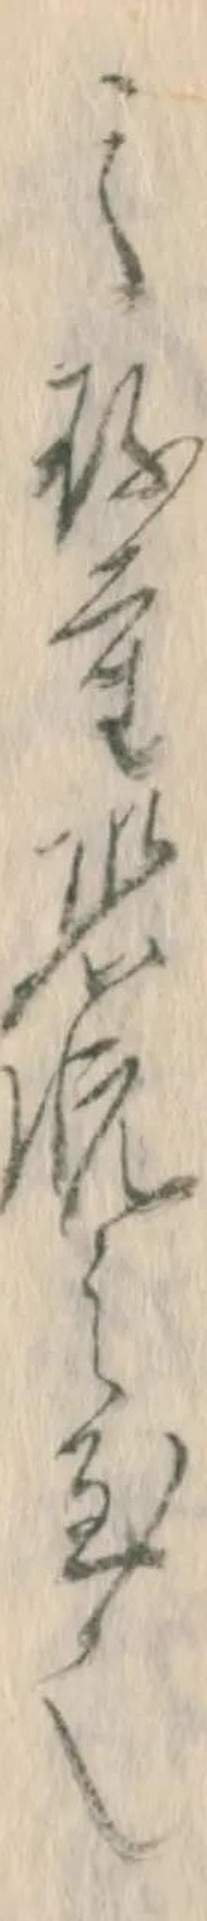之趣重恐悦之至也
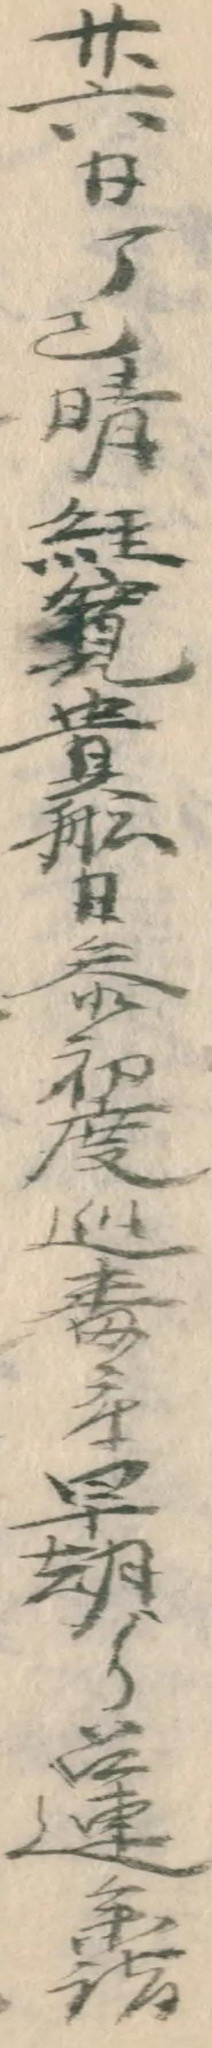廿六日丁巳晴経寛貴舩日参初度巡番ニ付早朝より召連参詣
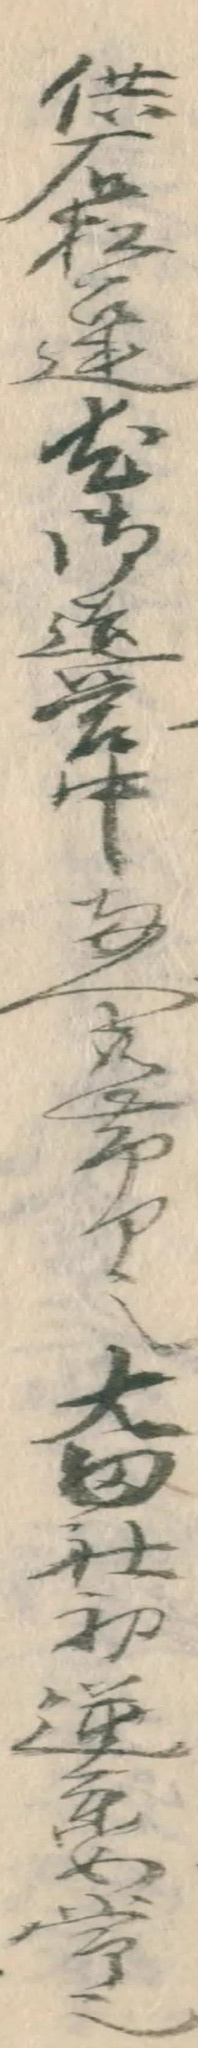供石松召連尤御造営中両人共帯刀也大田社初逆参如常也
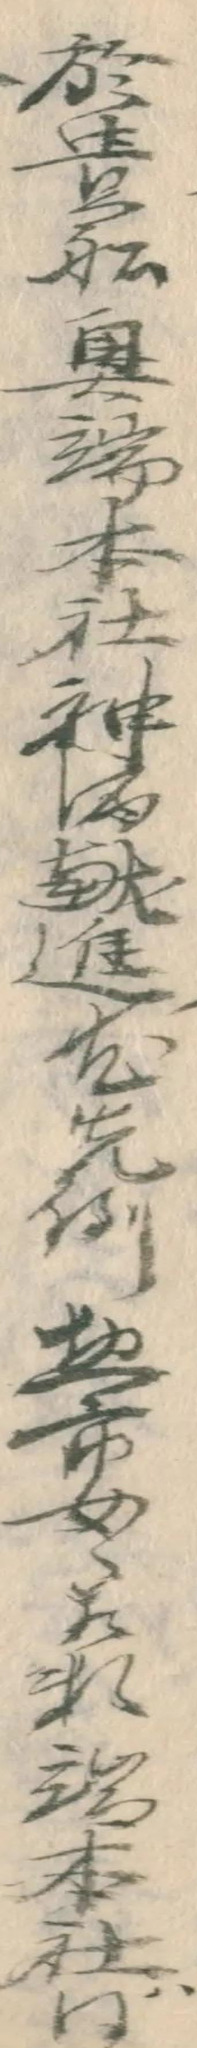於貴舩奥端本社神酒献進尤先例惣市女へ相頼端本社ハ同
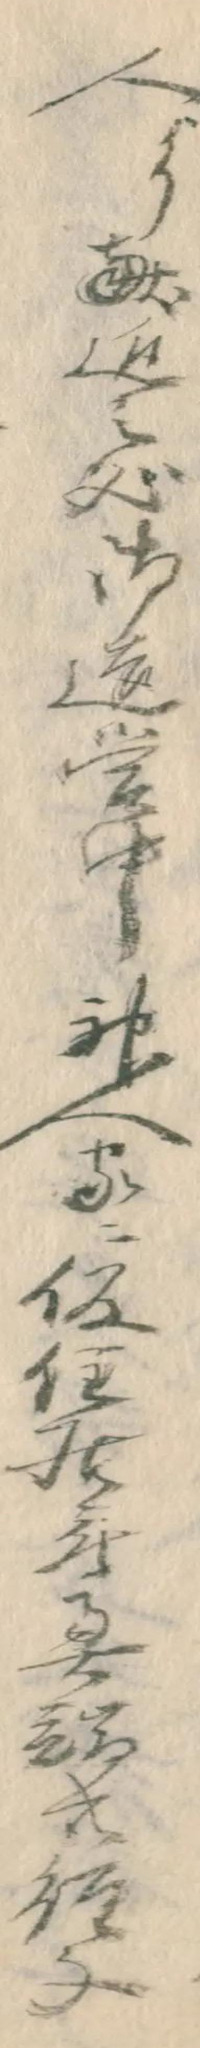人より献近之処御造営中神人家ニ仮住居ニ付奥端共経子
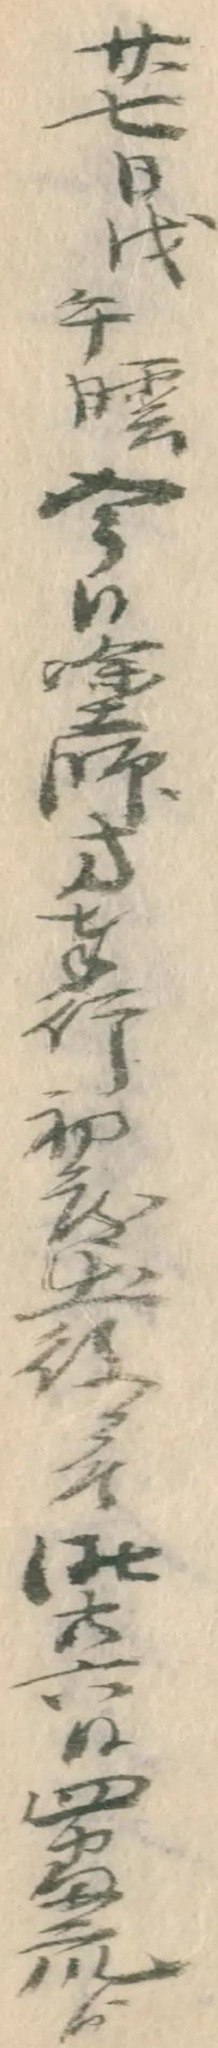廿七日戊午曇今日塗師方奉行初度出役に付昨廿六日四番衆ゟ

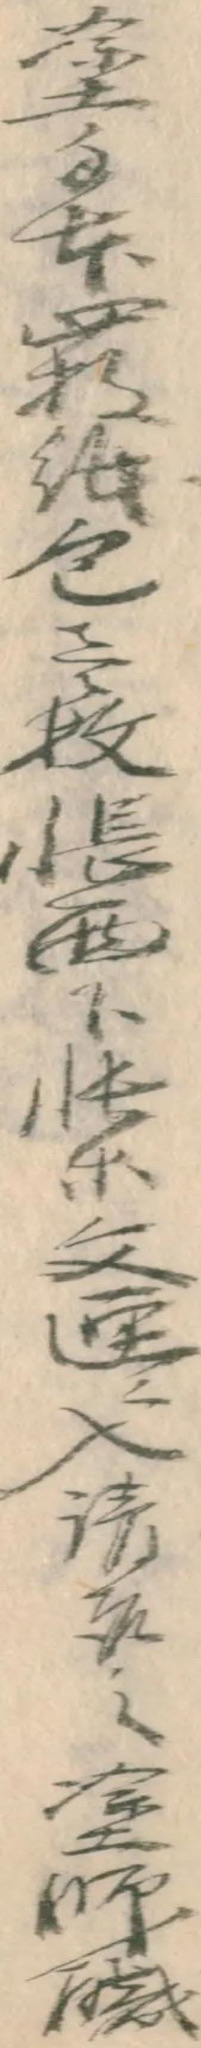塗手本四枚紙包壱枚帳面下帳等文匣ニ入請取之塗師職
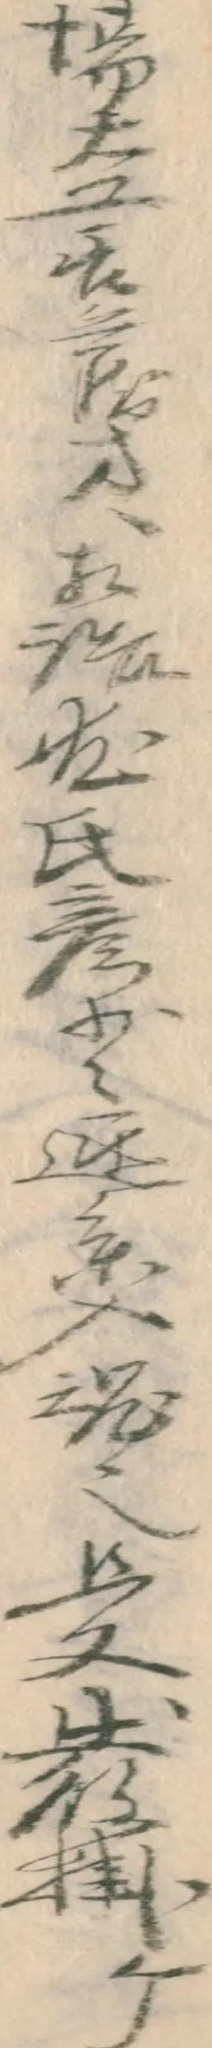場大工屋方へ相詰尤氏彦少々遅参入魂也且又出殿掛ケ
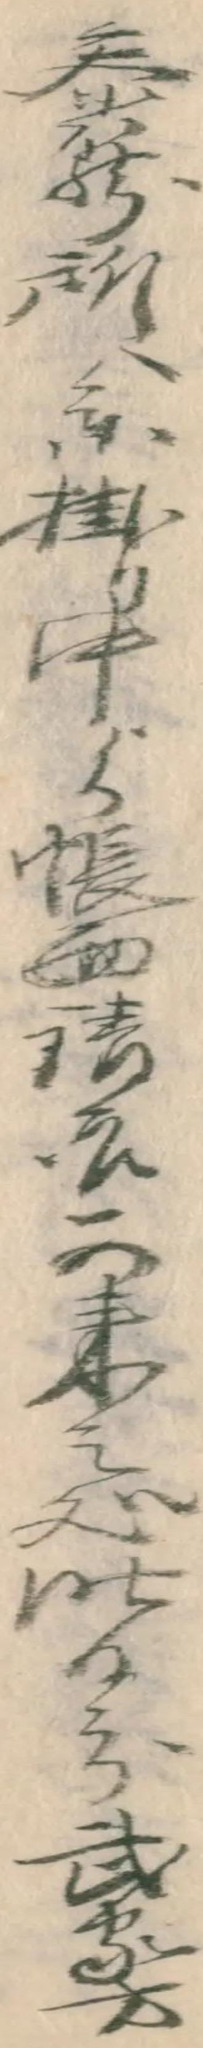参籠所へ参掛リ中より帳面請取可来之処昨日分武家方
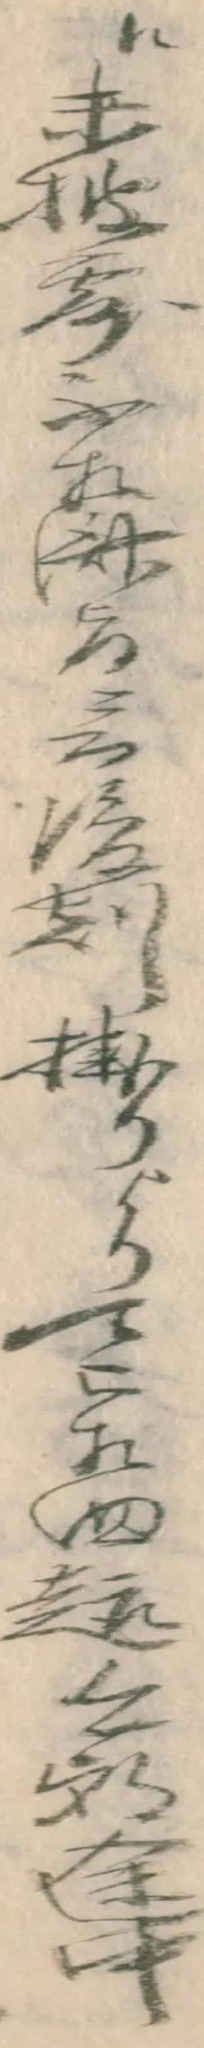え未披露不相済旨二而後刻掛りより可被相廻趣今朝途中
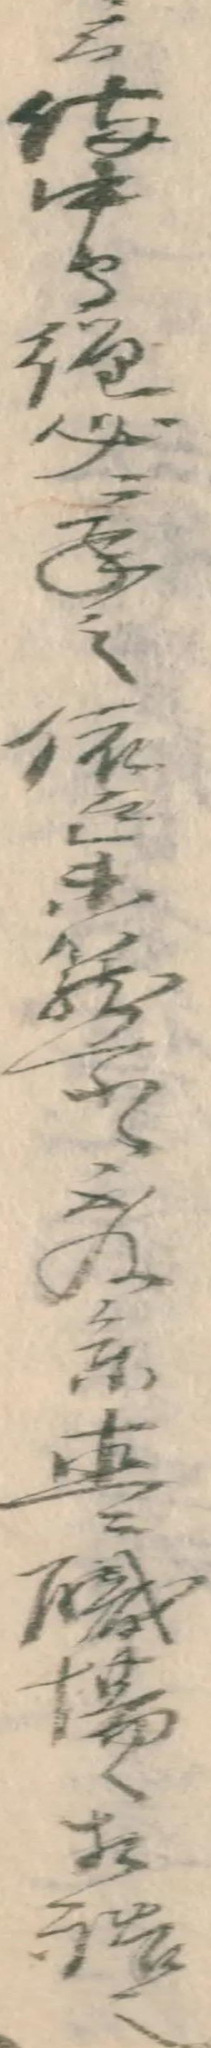ニ而備中守経必ニ承之依而参籠所へ不及参直ニ職場へ相詰候
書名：賀茂社記録. 第66冊
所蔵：国立国会図書館 National Diet Library, JAPAN
